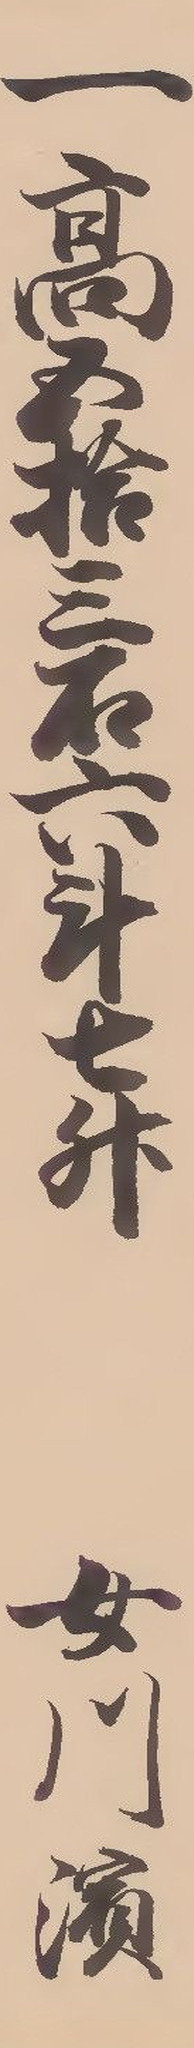一高五拾三石六斗七升女川浜

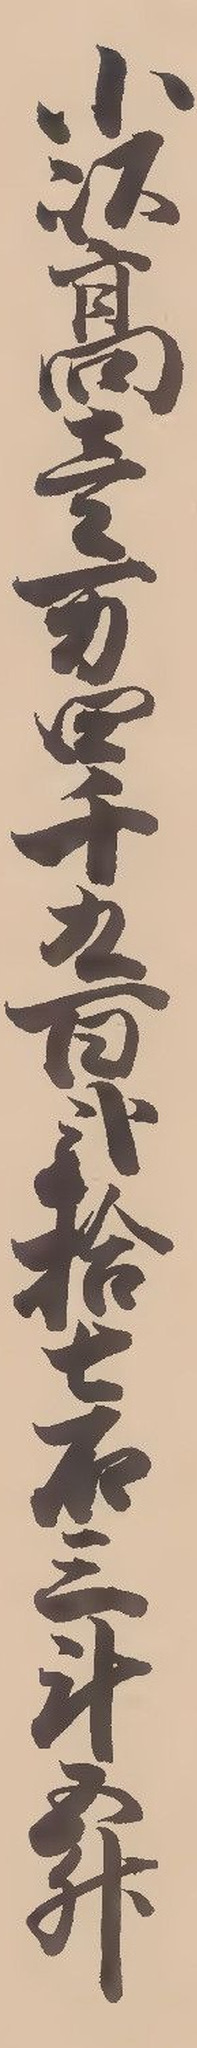小以高壱万四千九百弐拾七石三斗五升
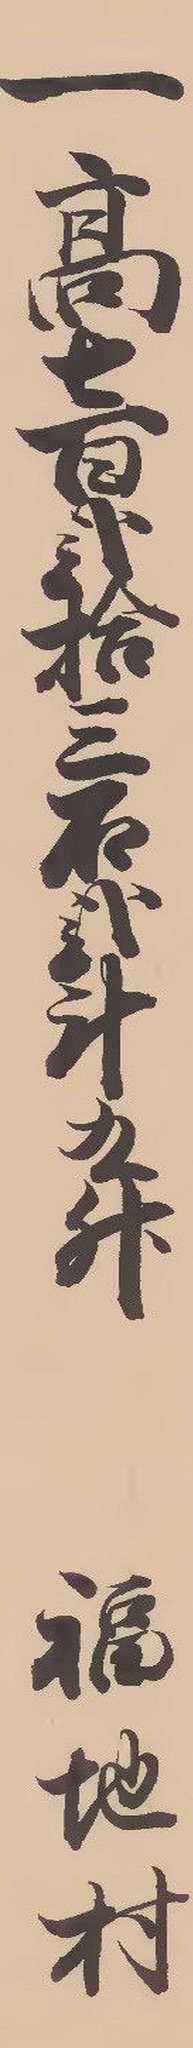一高七百弐拾三石弐斗九升福地村
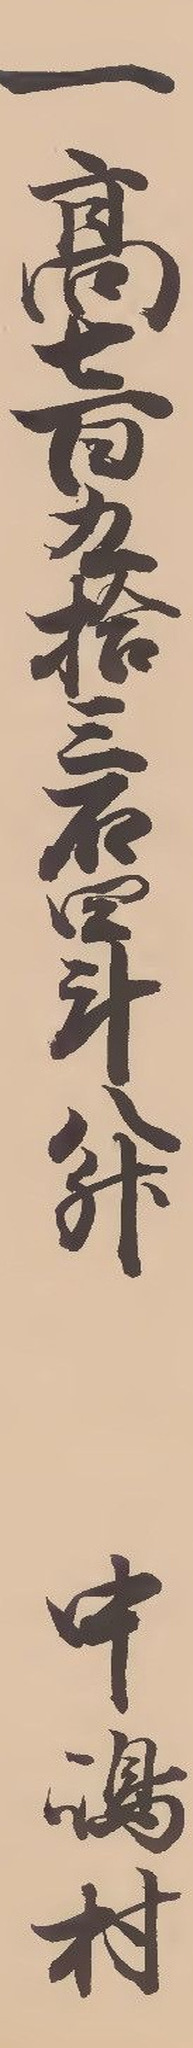一高七百九拾三石四斗八升中島村
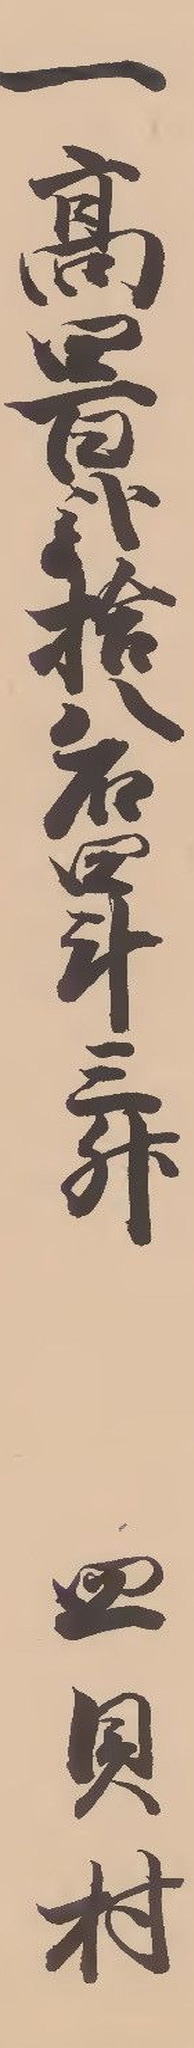一高四百弐拾八石四斗三升皿貝村

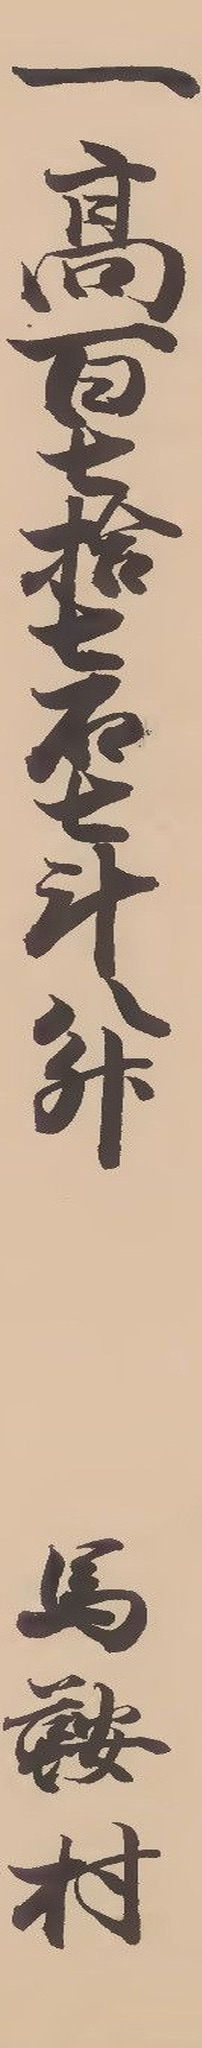一高百七拾七石七斗八升馬鞍村
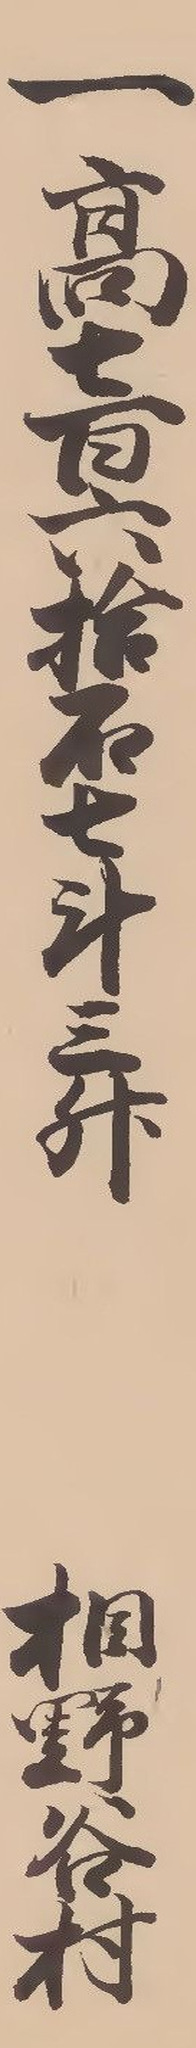一高七百六拾石七斗三升相野谷村
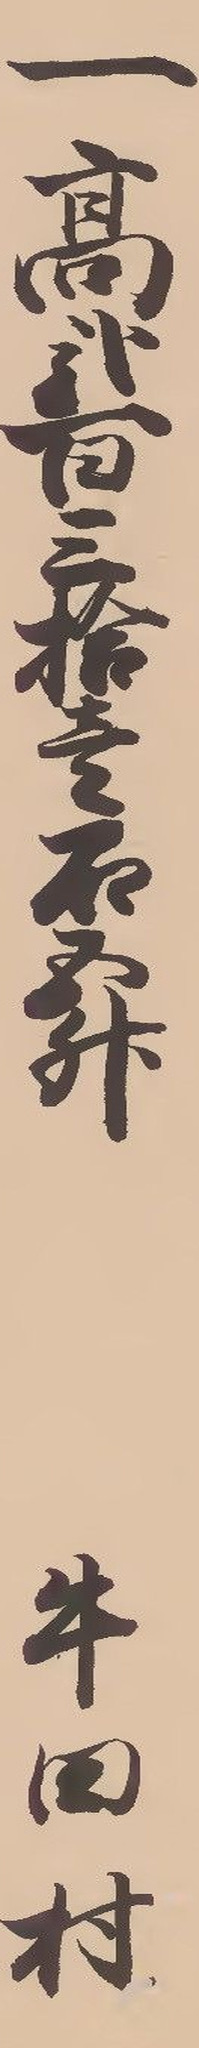一高弐百三拾壱石五升牛田村
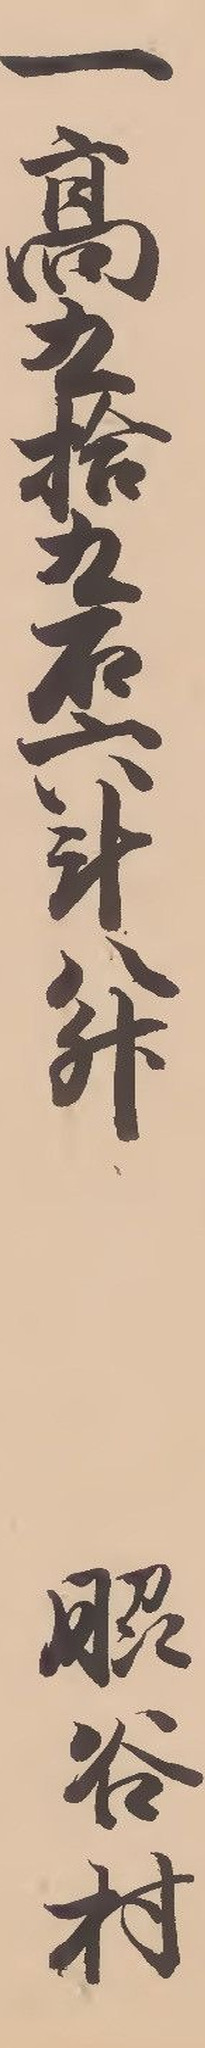一高九拾九石六斗八升脇谷村
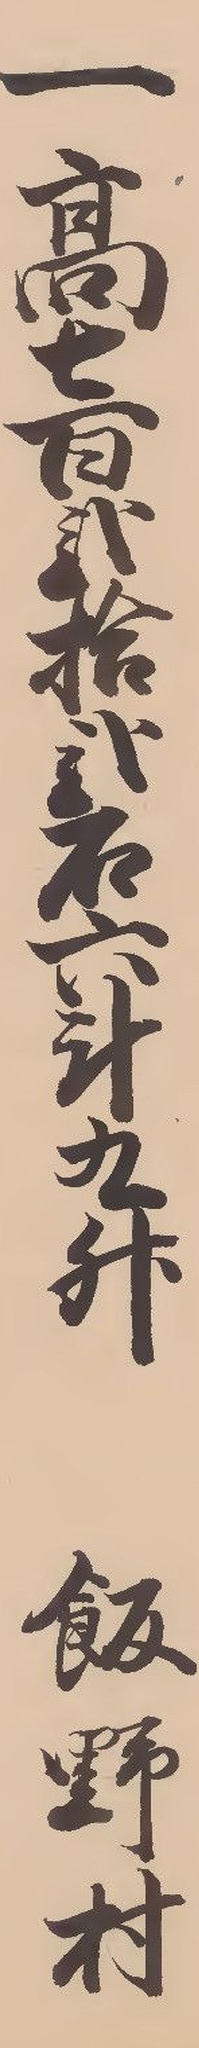一高七百弐拾弐石六斗九升飯野村
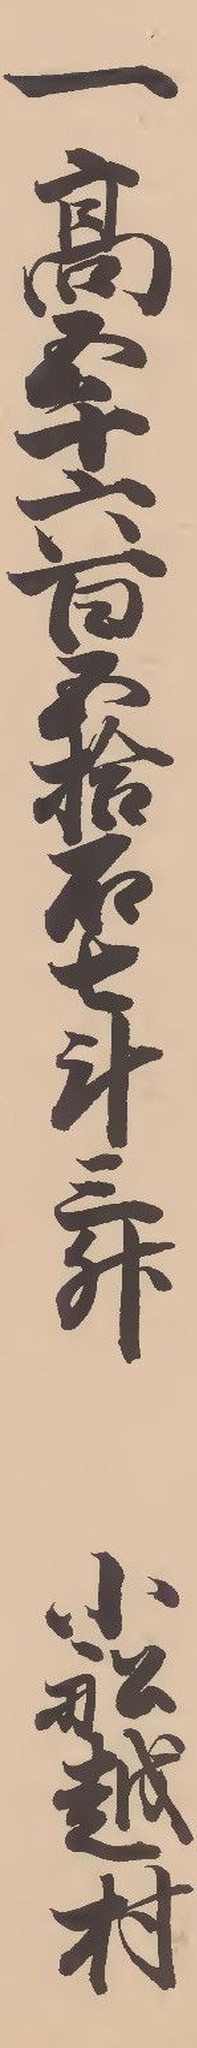一高五千六百五拾石七斗三升小船越村
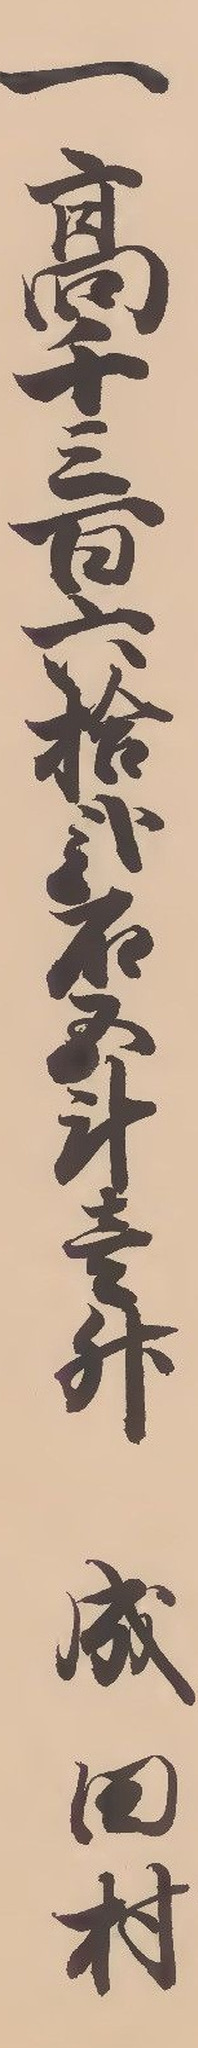一高千三百六拾弐石五斗壱升成田村

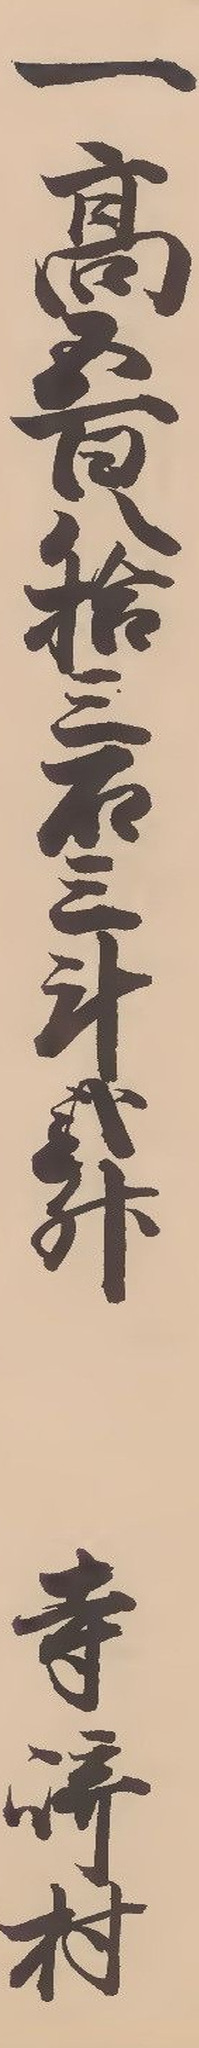一高五百八拾三石三斗弐升寺崎村
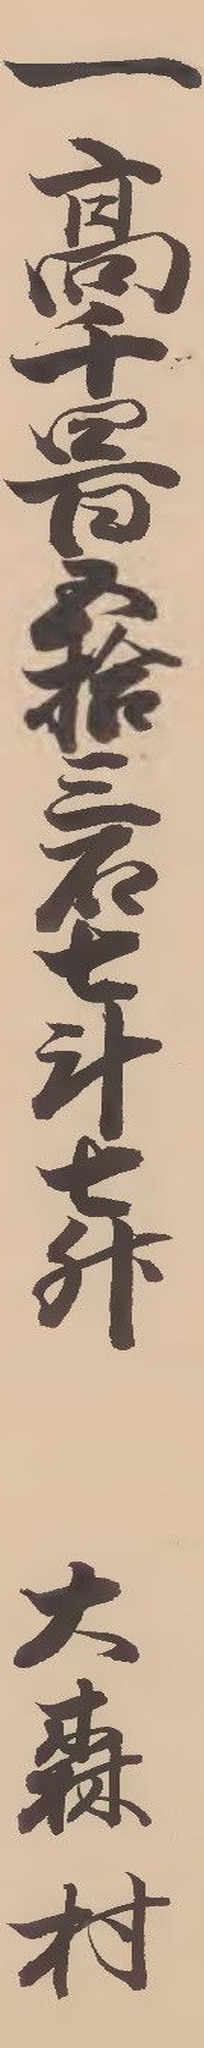一高千四百五拾三石七斗七升大森村
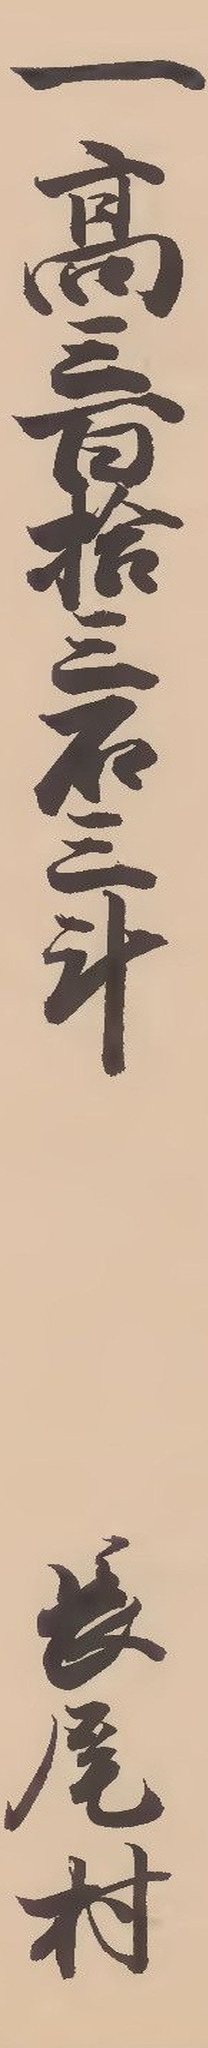一高三百拾三石三斗長尾村
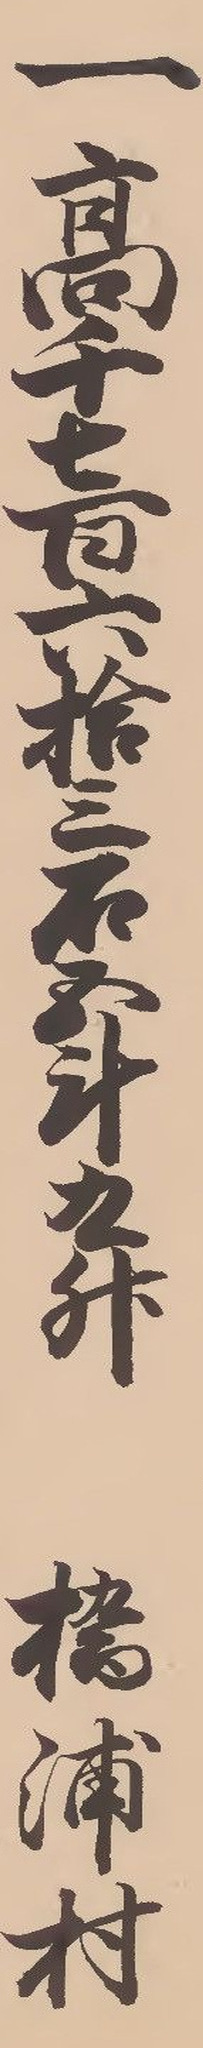一高千七百六拾三石五斗九升橋浦村
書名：陸奥国郷帳　５
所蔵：国立公文書館 National Archives of Japan
